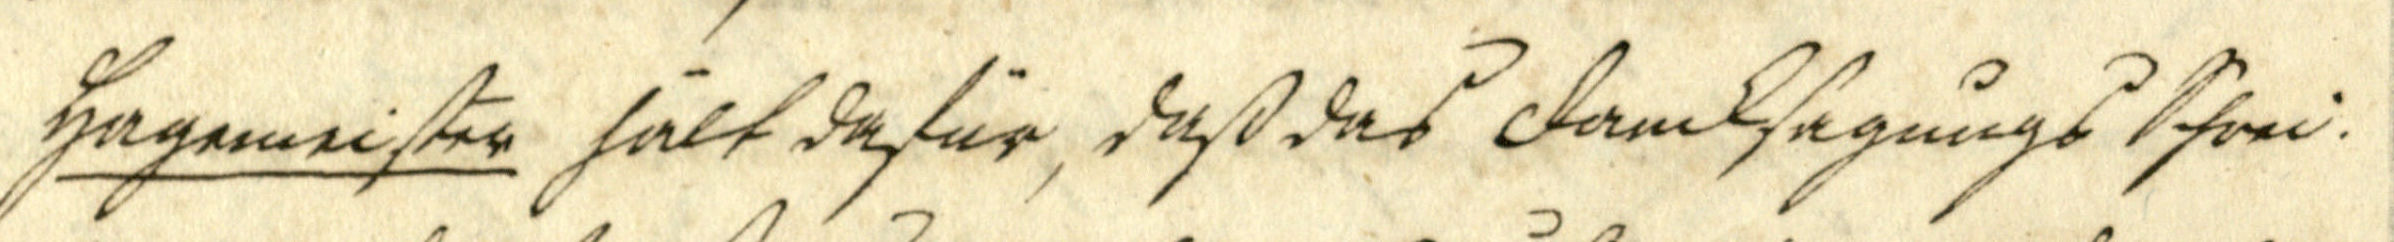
Hagemeister hält dafür, daß das Dancksagungs Schrei¬
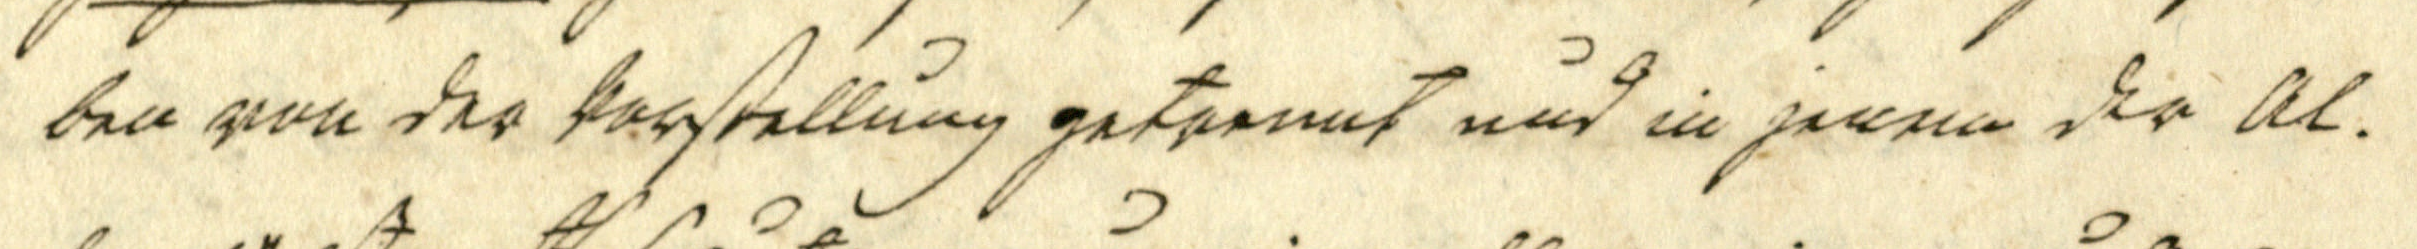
ben von der Vorstellung getrennt und in jenem der Al¬
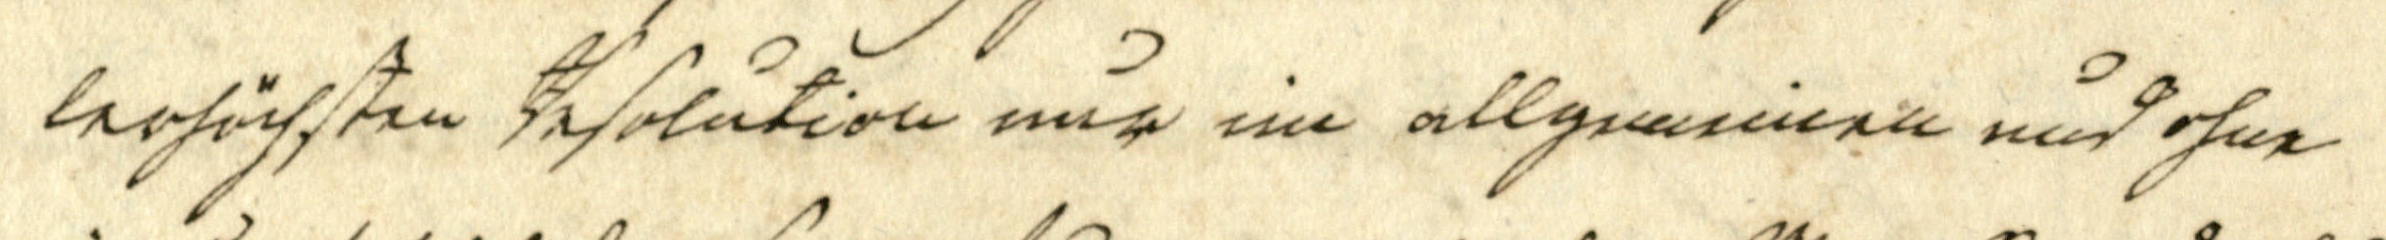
lerhöchsten Resolution nur im allgemeinen und ohne
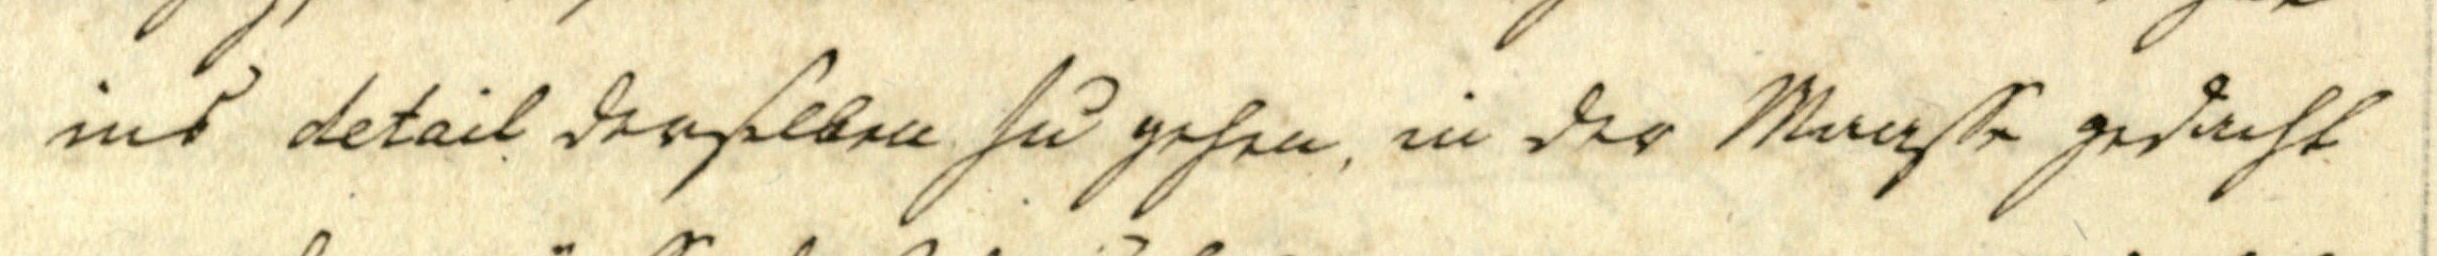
ins detail derselben zu gehen, in der Maasse gedacht
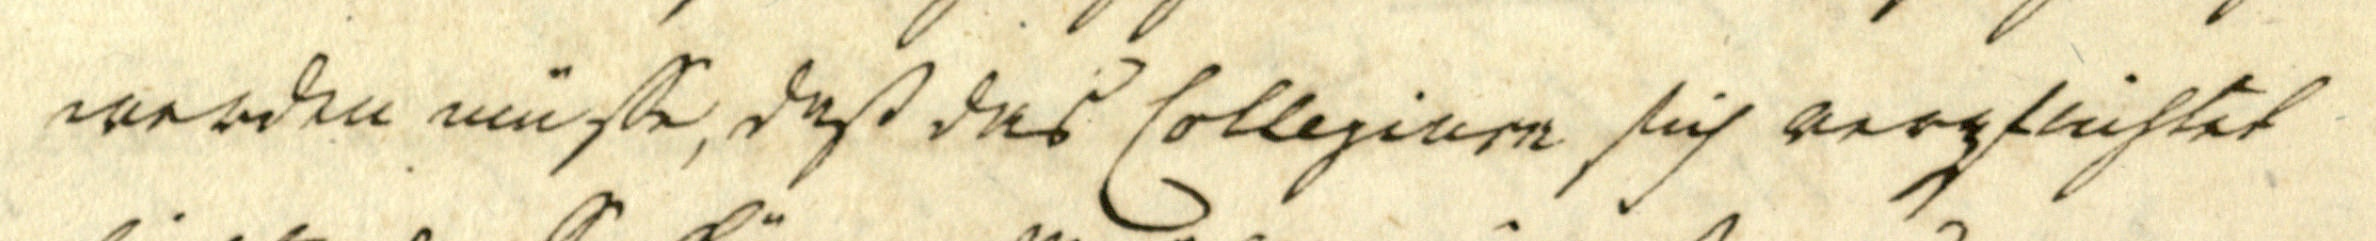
werden müsse, daß das Collegium sich verpflichtet
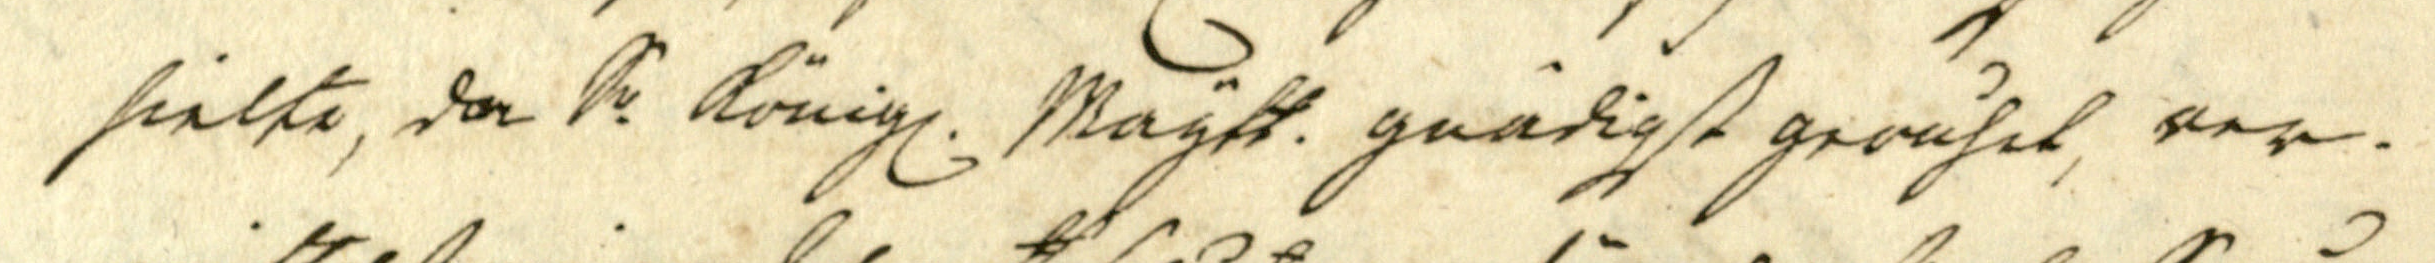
hielte, da Sr Königl. Maÿtt. gnädigst geruhet, ver¬
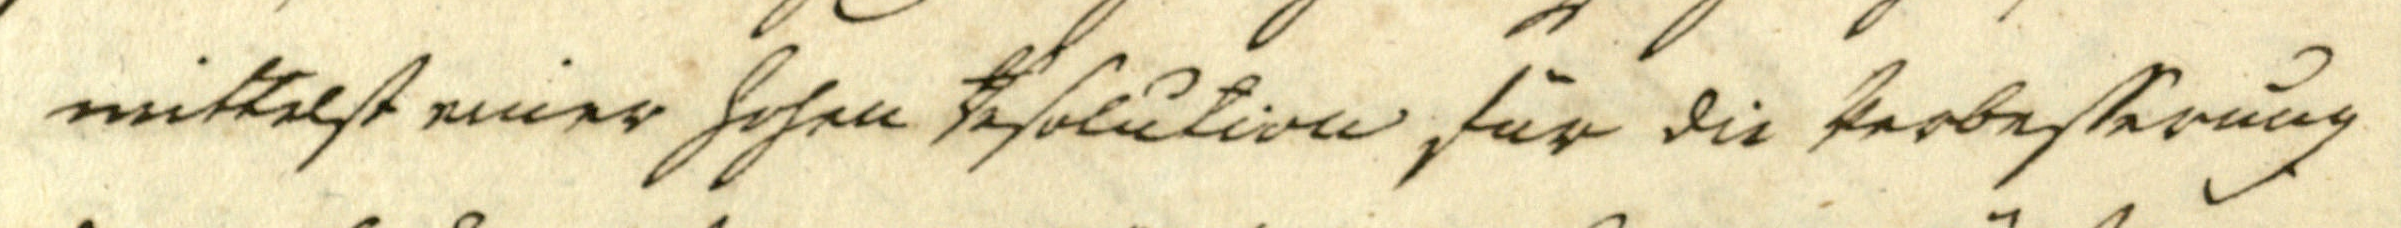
mittelst einer Hohen Resolution für die Verbesserung
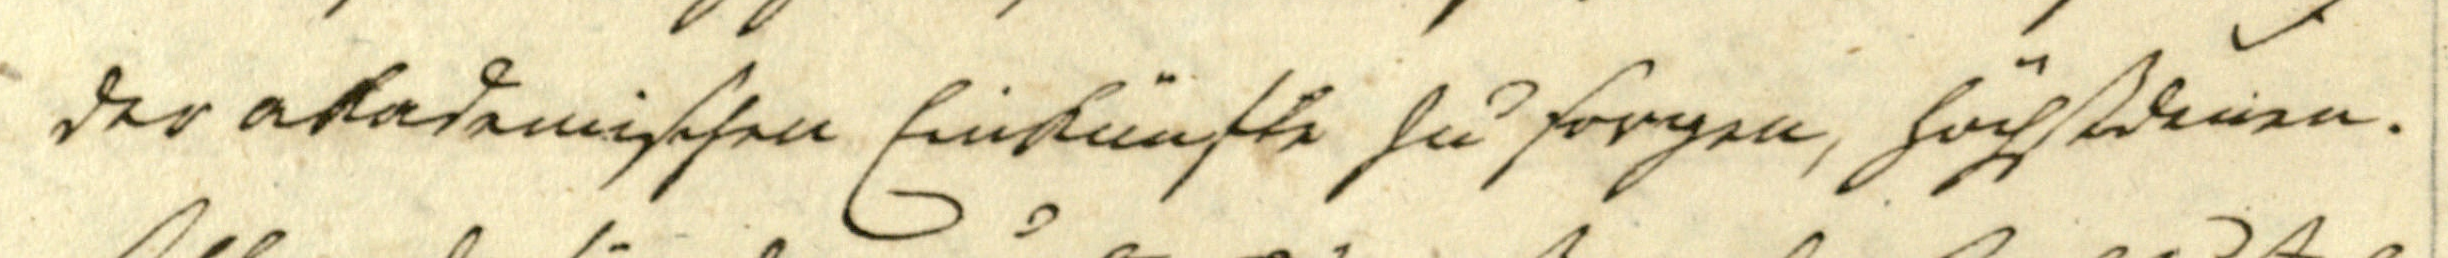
der akademischen Einkünfte zu sorgen, Höchstdenen¬
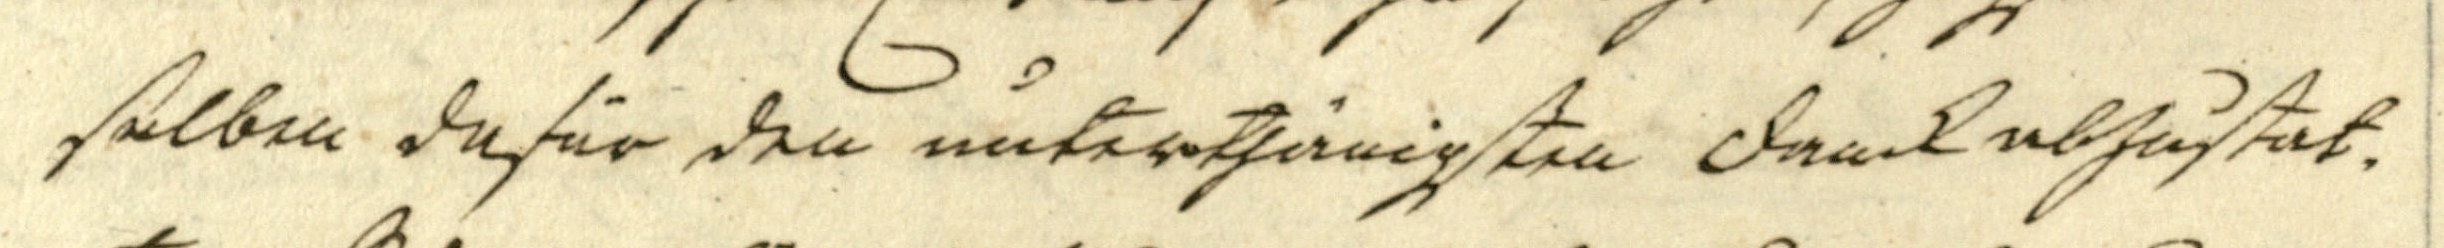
selben dafür den unterthänigten Danck abzustat¬
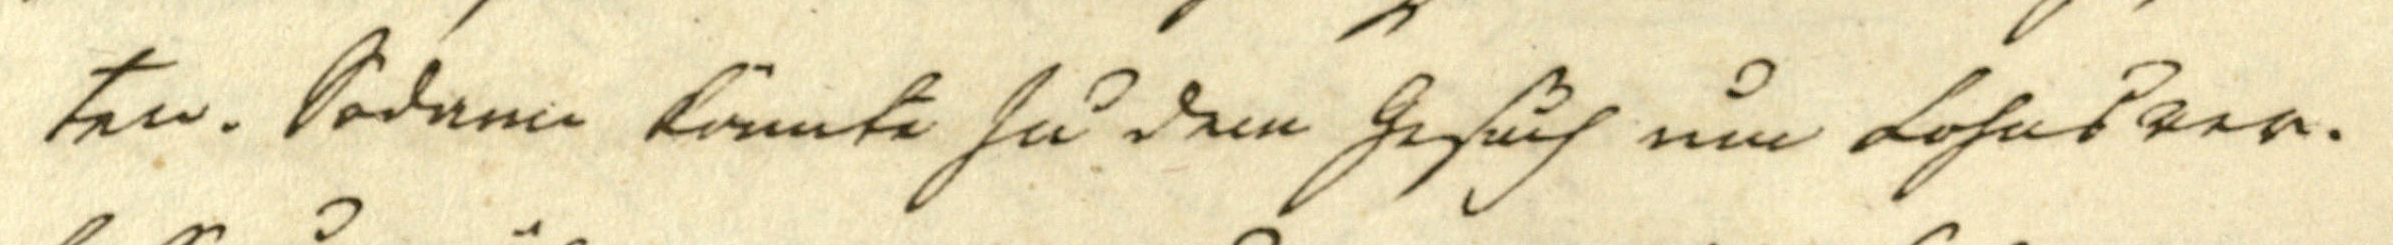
ten. Sodann könnte zu dem Gesuch um Lohnsver
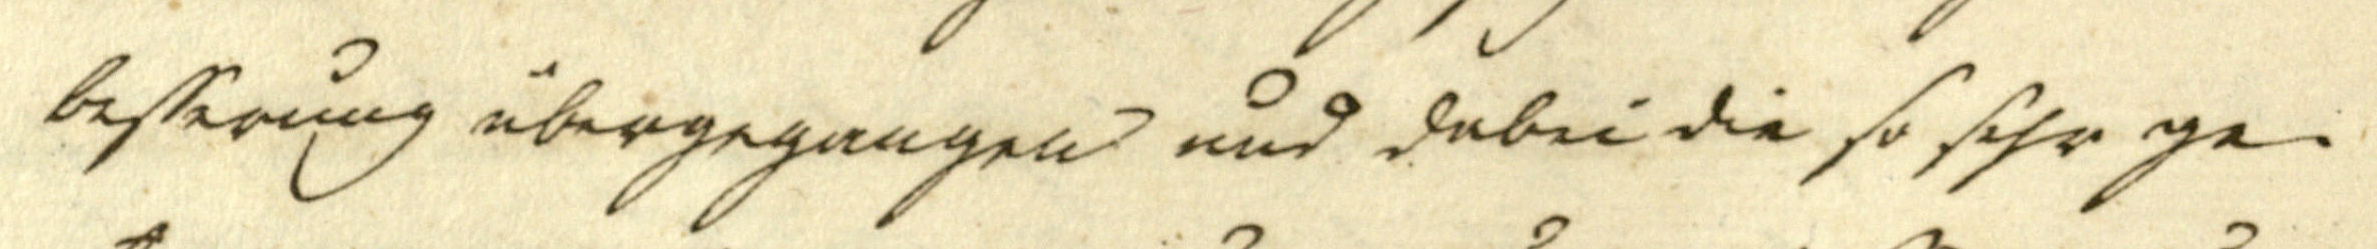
besserung übergegangen und dabei die so sehr ge¬
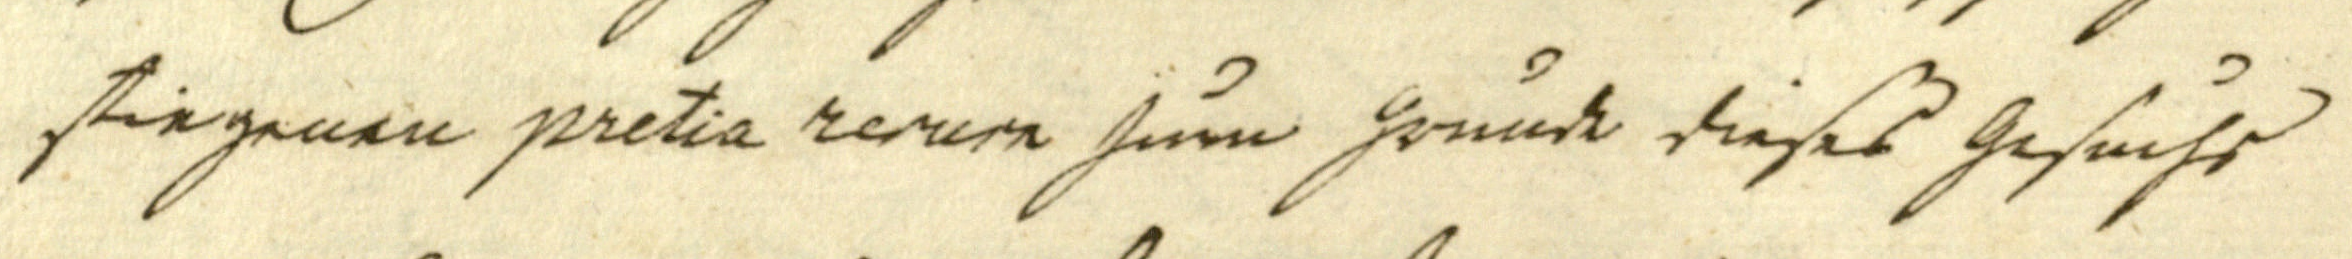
stiegenen pretia rerum zum Grunde dieses Gesuchs
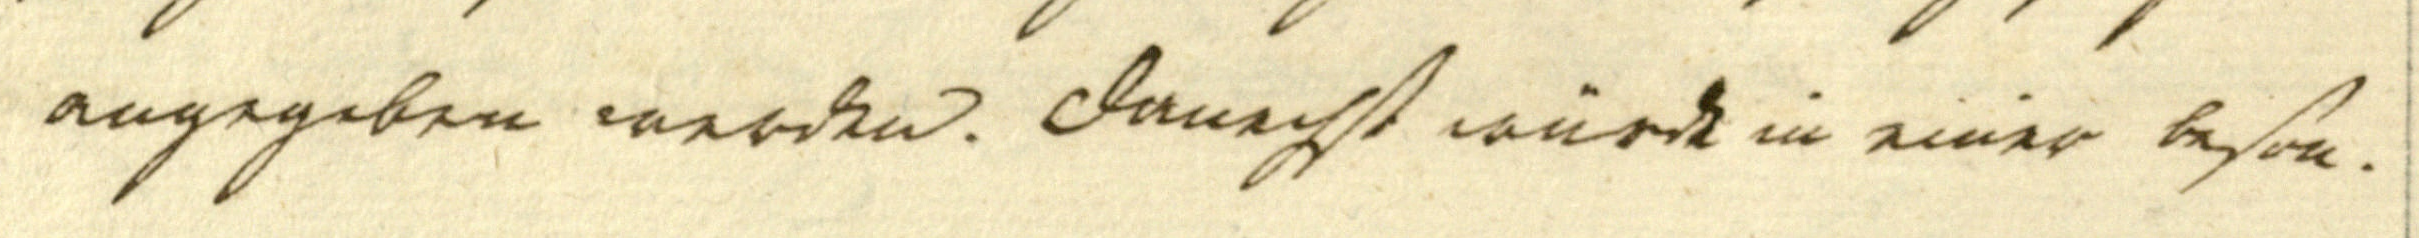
angegeben werden. Danechst würde in einer beson¬
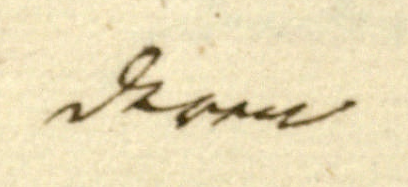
deren
